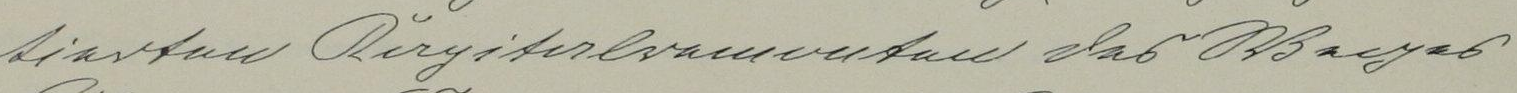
tierten Kapitalremonten des Weges
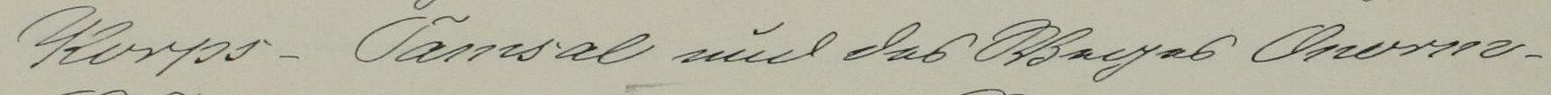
Korps – Tamsal und des Weges Onorm –
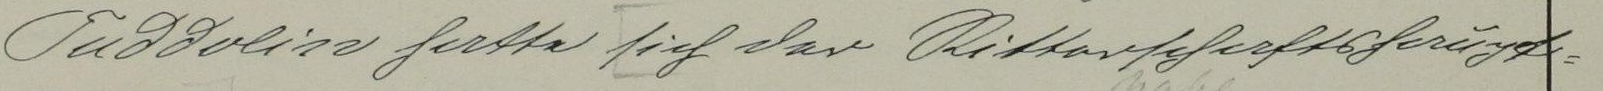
Tuddolin hatte sich der Ritterschaftshaupt-
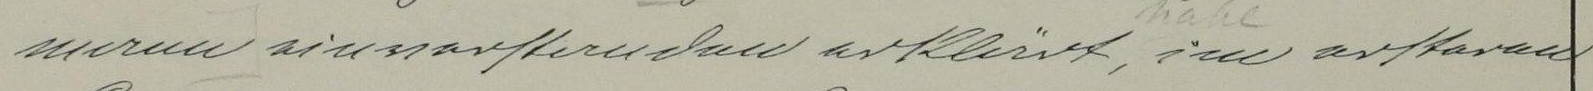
mann einverstanden erklärt, im ersteren
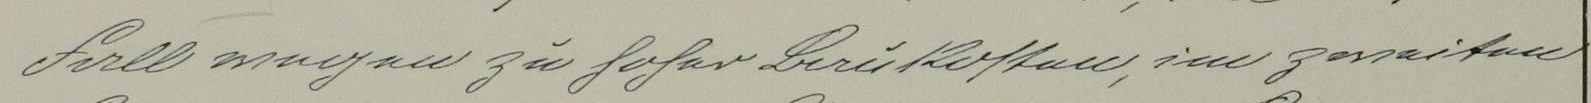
Fall wegen zu hoher Baukosten, im zweiten
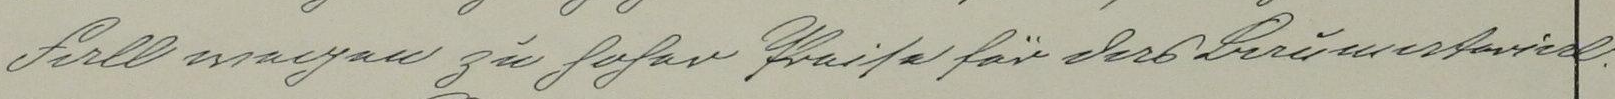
Fall wegen zu hoher Preise für das Baumaterial.
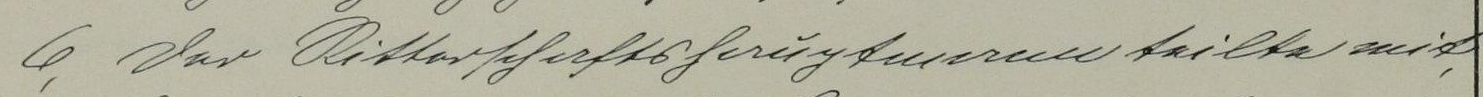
6. Der Ritterschaftshauptmann teilte mit,
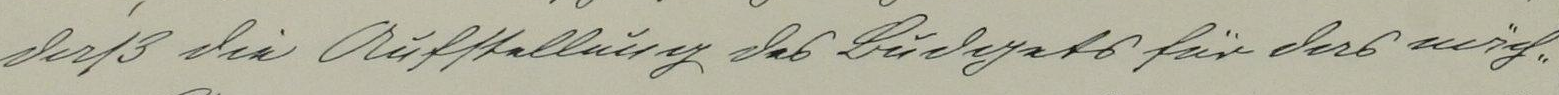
daß die Aufstellung des Budgets für das näch-
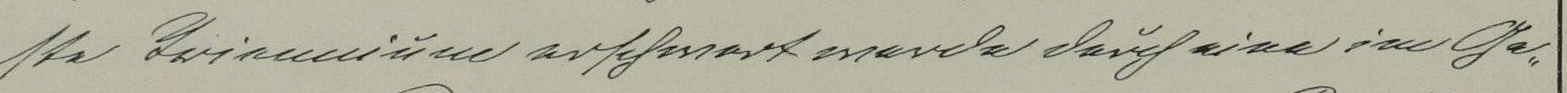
ste Triennium erschwert werde durch eine im Ge-
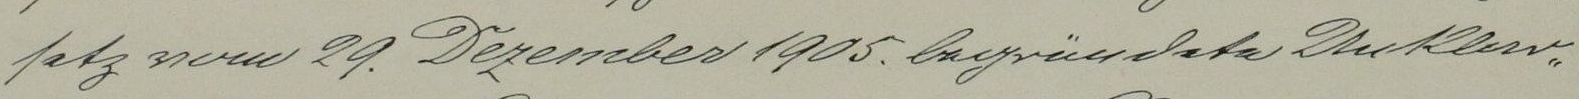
setz vom 29. Dezember 1905. begründete Unklar-
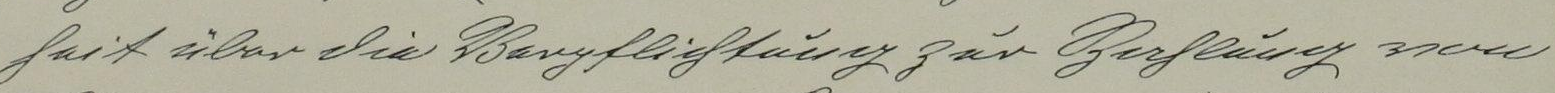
heit über die Verpflichtung zur Zahlung von
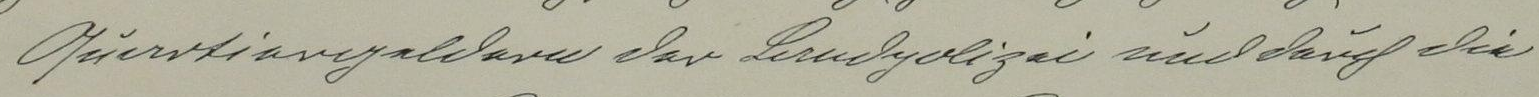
Quartiergeldern der Landpolizei und durch die
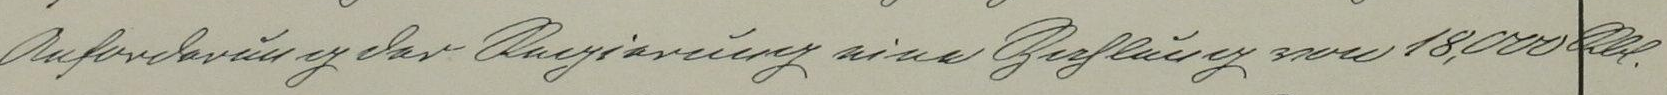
Anforderung der Regierung eine Zahlung von 18.000 Rbl.
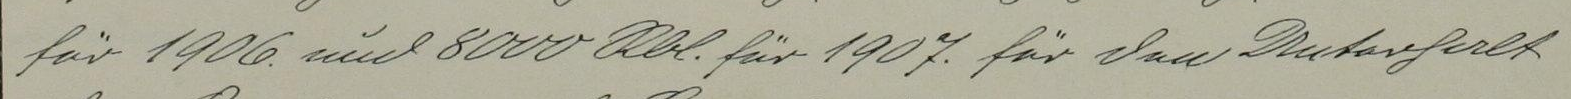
für 1906. und 8000 Rbl. für 1907. für den Unterhalt
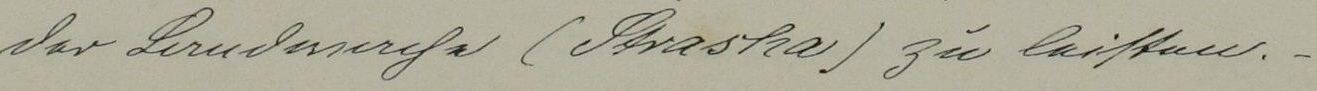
der Landwache (Strasha) zu leisten.
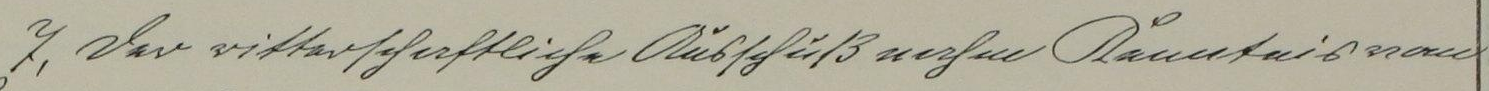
7. Der ritterschaftliche Ausschuß nahm Kenntnis vom
